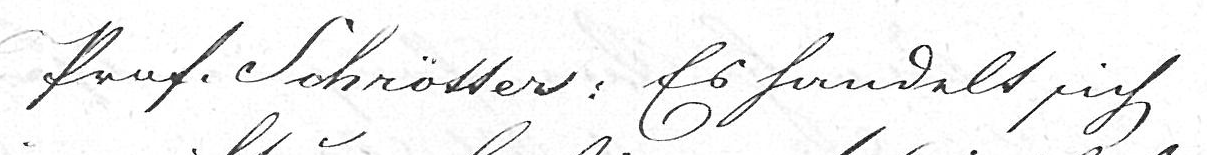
Prof. Schrötter: Es handelt sich
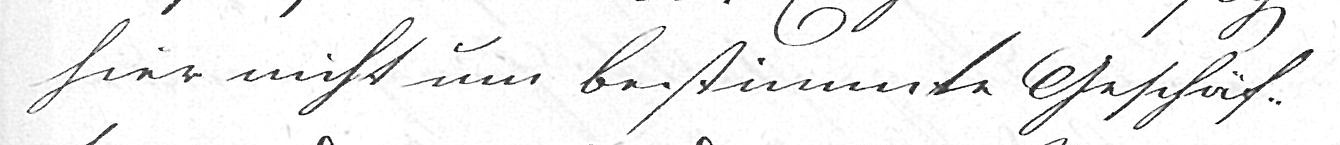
hier nicht um bestimmte Geschäf-
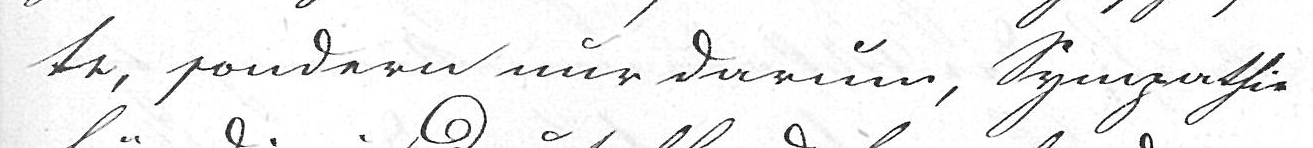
te, sondern nur darum, Sympathie
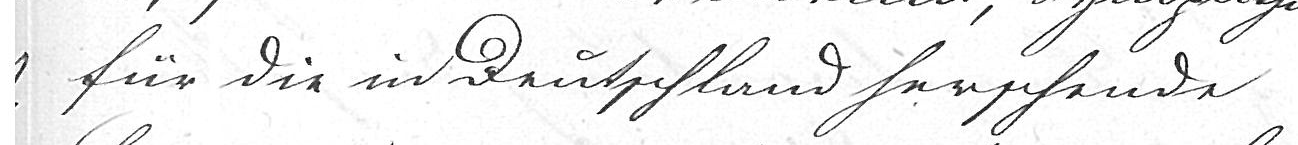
für die in Deutschland herrschende
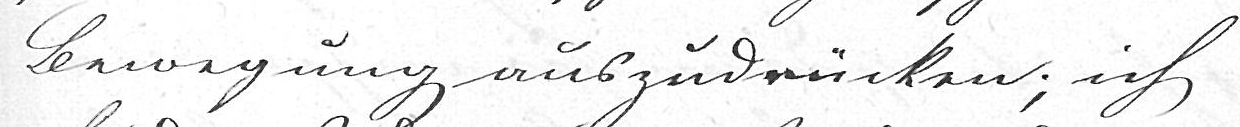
Bewegung auszudrücken; ich
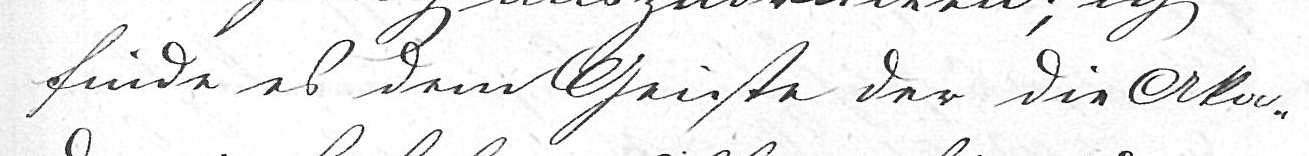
finde es dem Geiste der die Aka-
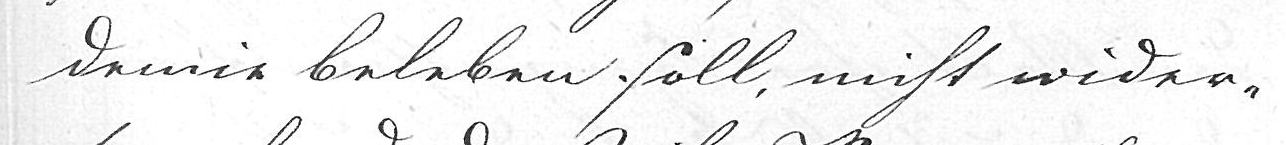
demie beleben soll, nicht wider-
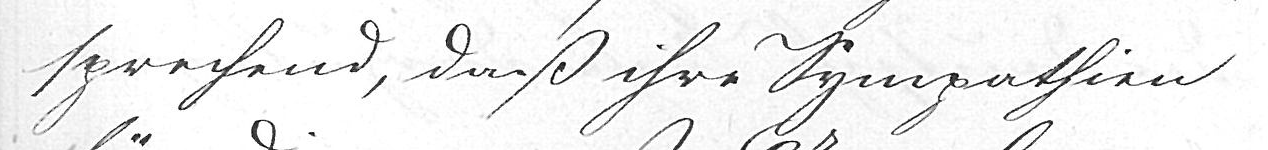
sprechend, daß ihre Sympathien
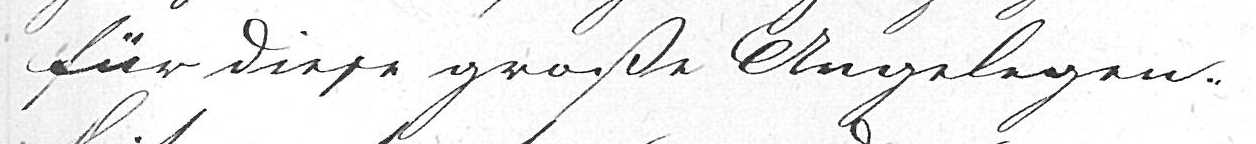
für diese große Angelegen-
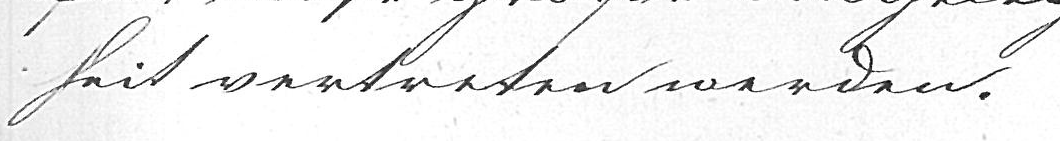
heit vertreten werden.
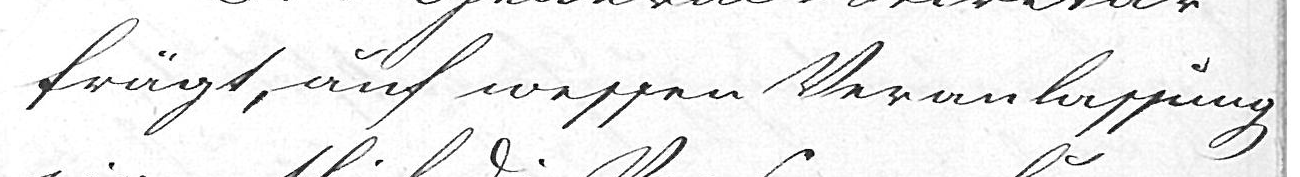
frägt, auf wessen Veranlassung
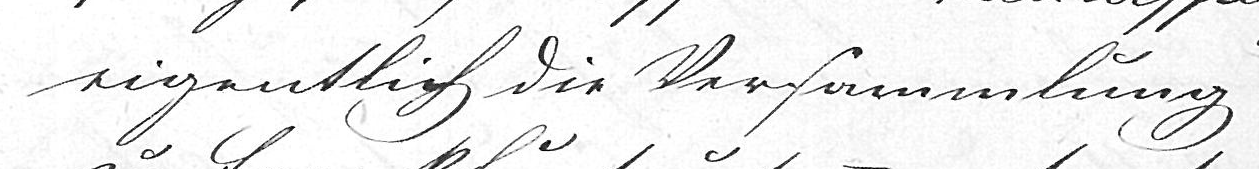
eigentlich die Versammlung
